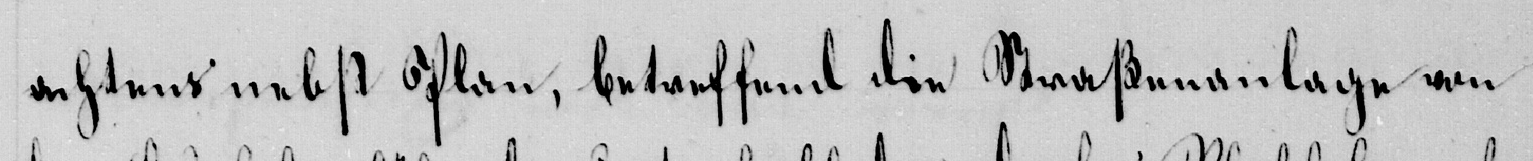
achtens nebst Plan, betreffend die Straßenanlage von
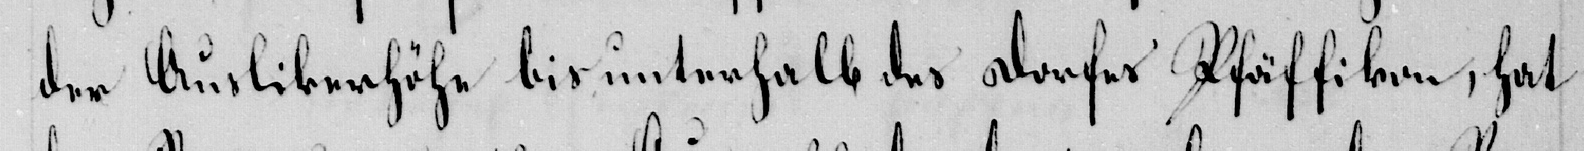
der Auslikerhöhe bis unterhalb des Dorfes Pfäffikon, hat
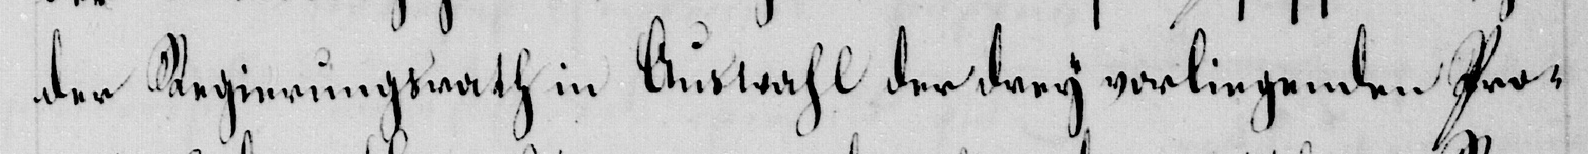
der Regierungsrath in Auswahl der drey vorliegenden Pro¬
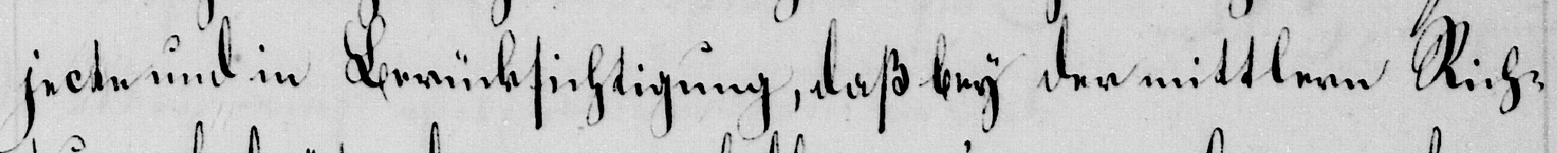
jecte und in Berücksichtigung, daß bey der mittlern Rich¬
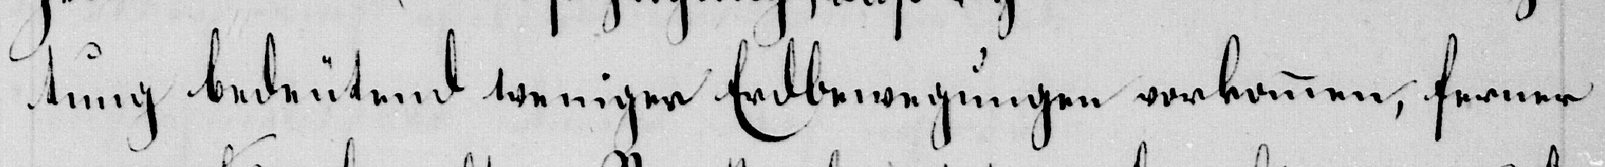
tung bedeutend weniger Erdbewegungen vorkommen, ferner
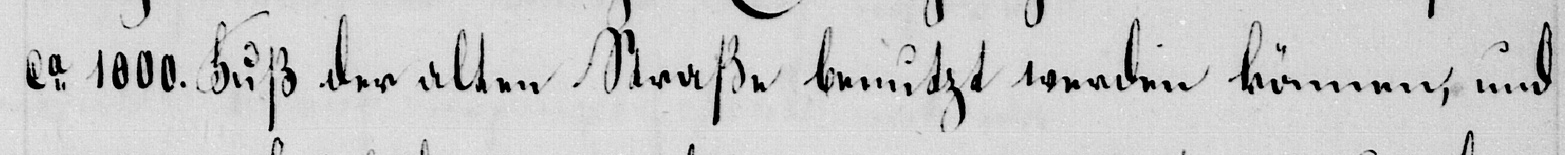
ca. 1000. Fuß der alten Straße benutzt werden können, und
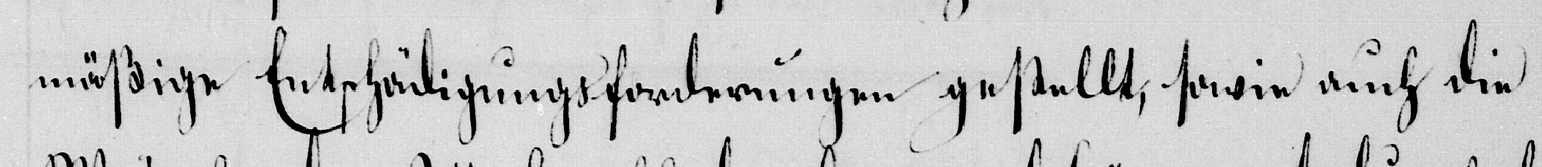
mäßige Entschädigungsforderungen gestellt, sowie auch die
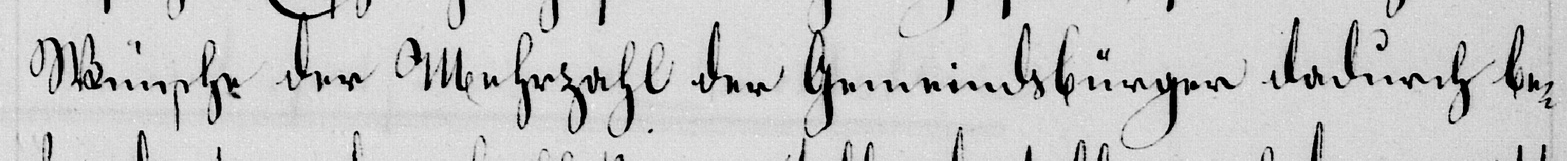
Wünsche der Mehrzahl der Gemeindsbürger dadurch be¬
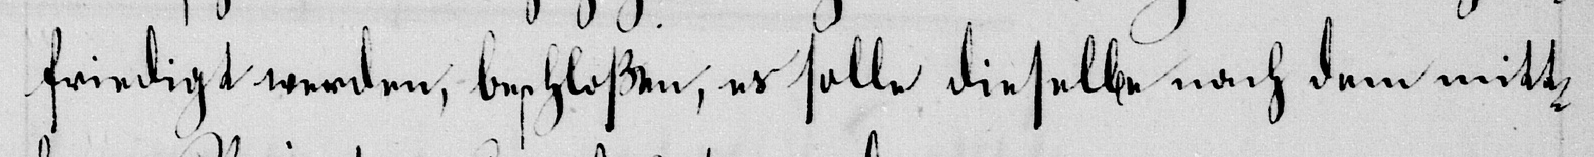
friedigt werden, beschloßen, es solle dieselbe nach dem mitt¬
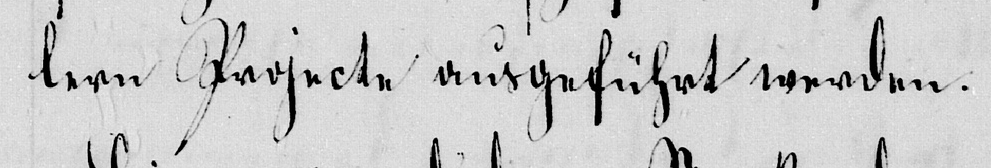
lern Projecte ausgeführt werden.
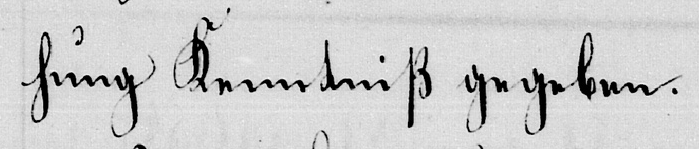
hung Kenntniß gegeben
